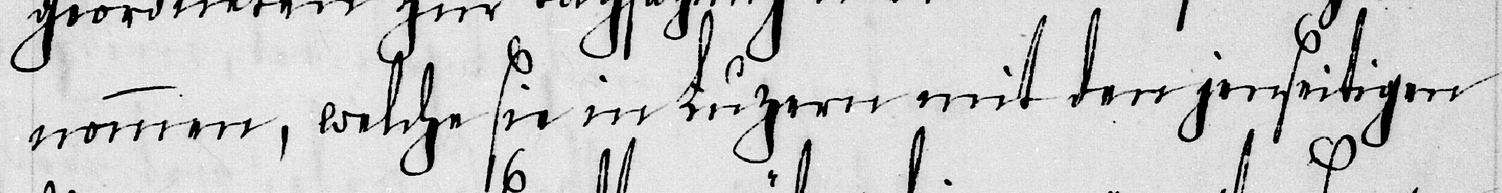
nommen, welche sie in Luzern mit den jenseitigen
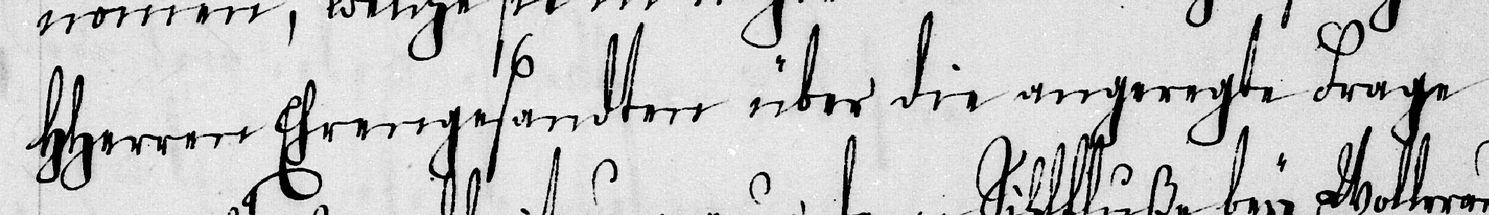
HHerren Ehrengesandten über die angeregte Frage
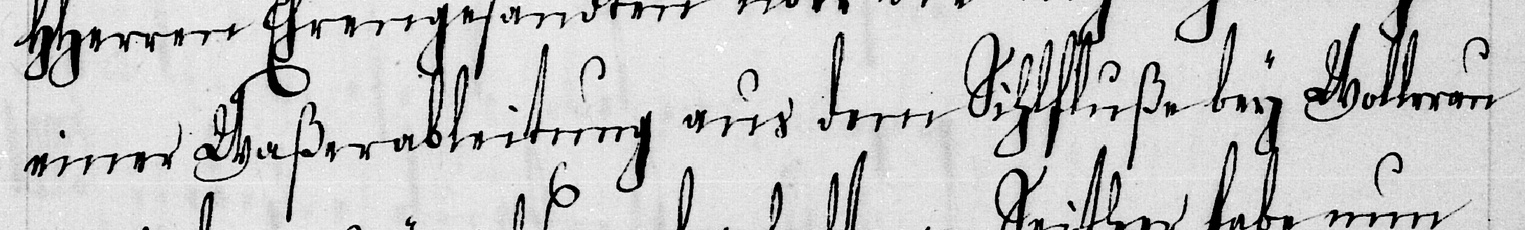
einer Waßerableitung aus dem Sihlfluße bey Wollerau
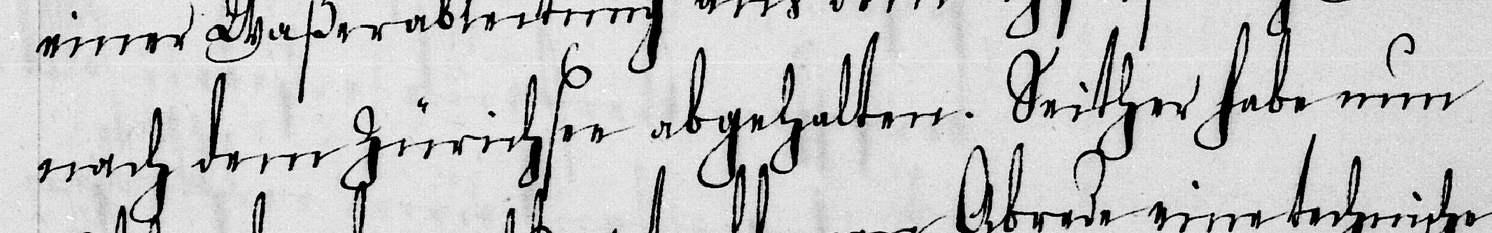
nach dem Zürichsee abgehalten. Seither habe nun
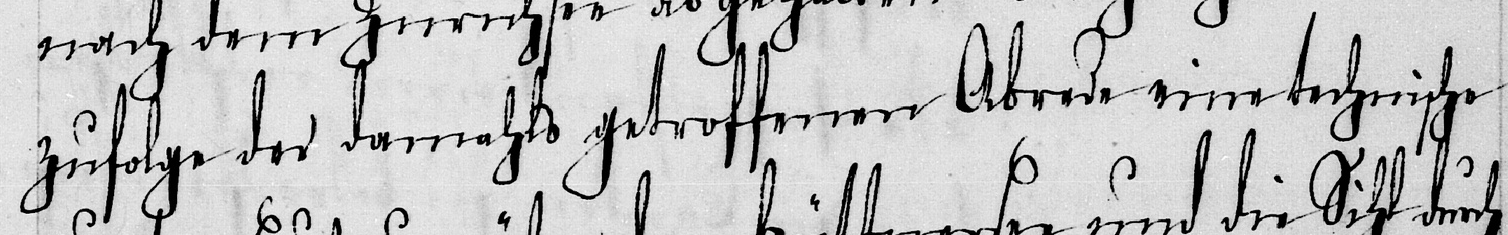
zufolge der damahls getroffenen Abrede eine technische
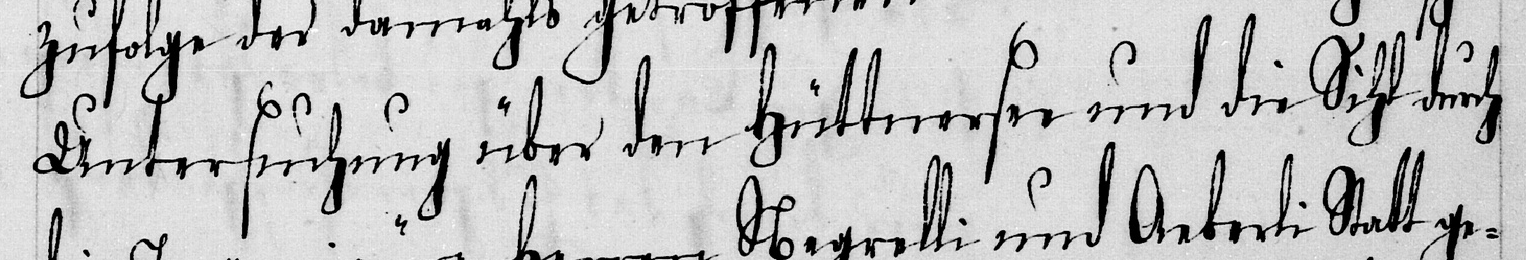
Untersuchung über den Hüttnersee und die Sihl durch
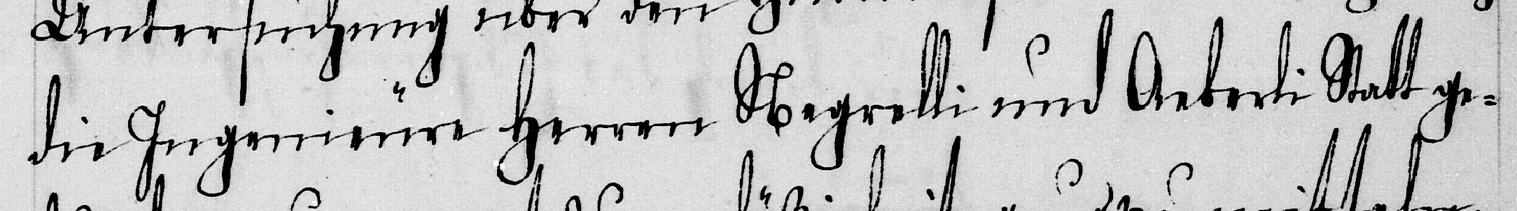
die Ingenieure Herren Negrelli und Aeberli Statt g¬
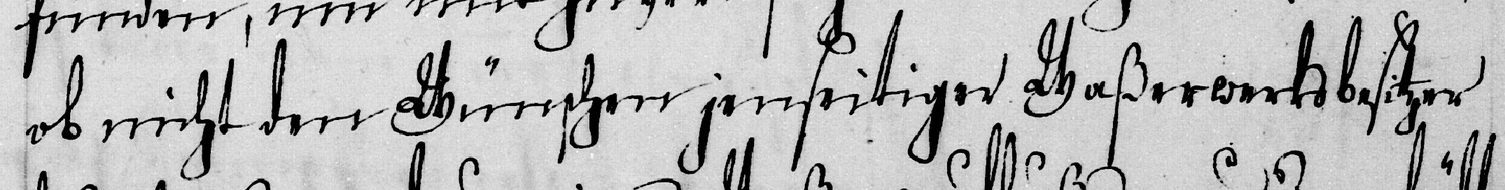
ob nicht den Wünschen jenseitiger Waßerwerksbesitzer
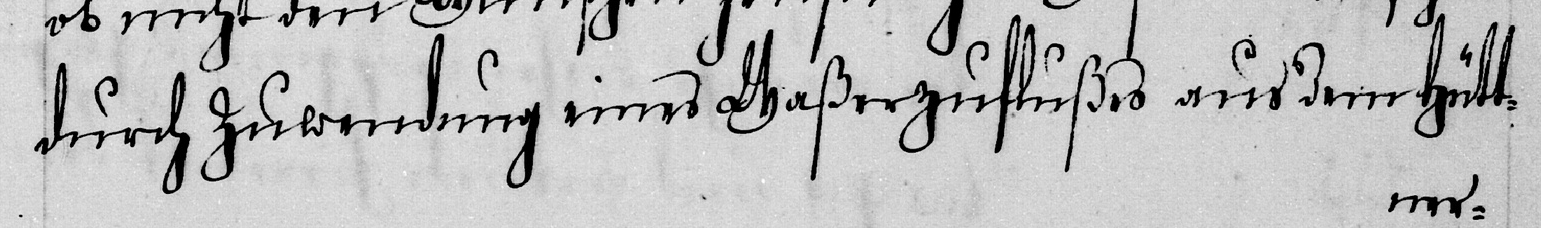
durch Zuwendung eines Waßerzuflußes aus dem Hütt-
